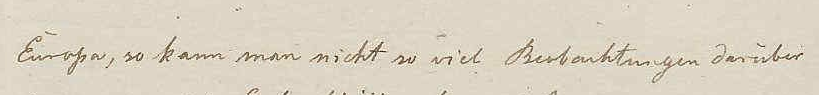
Europa, so kann man nicht so viel Beobachtungen darüber
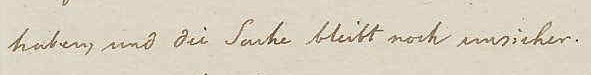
haben, und die Sache bleibt noch unsicher.
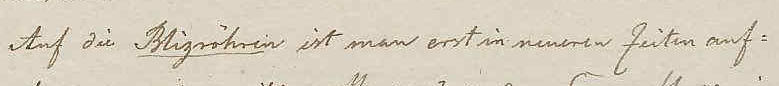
Auf die Blizröhren ist man erst in neueren Zeiten auf-
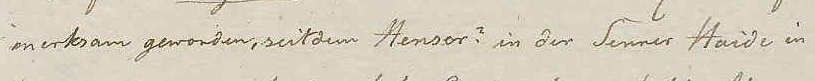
merksam geworden, seitdem Henser ? in der Senner Haide in
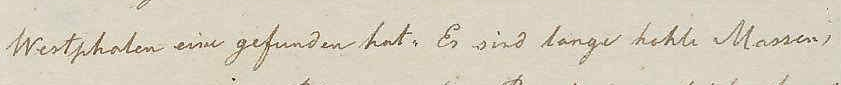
Westphalen eine gefunden hat. Es sind lange hohle Massen,
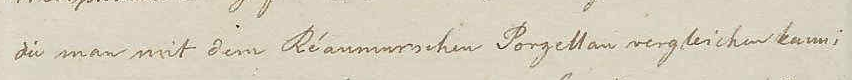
die man mit dem Réaumurschen Porzellan vergleichen kann;
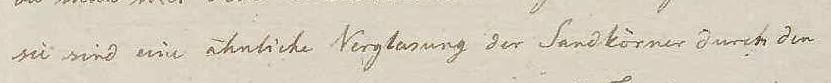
sie sind eine ähnliche Verglasung der Sandkörner durch den
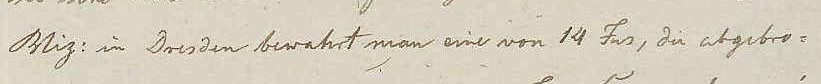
Bliz: in Dresden bewahrt man eine von 14 Fus, die abgebro-
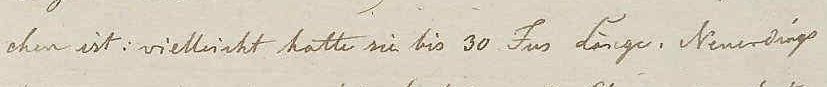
chen ist: vielleicht hatte sie bis 30 Fus Länge. Neuerdings
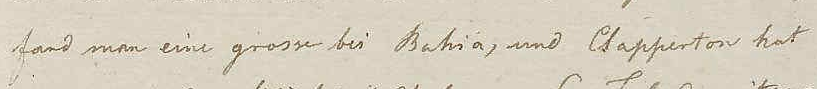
fand man eine grosse bei Bahia, und Clapperton hat
